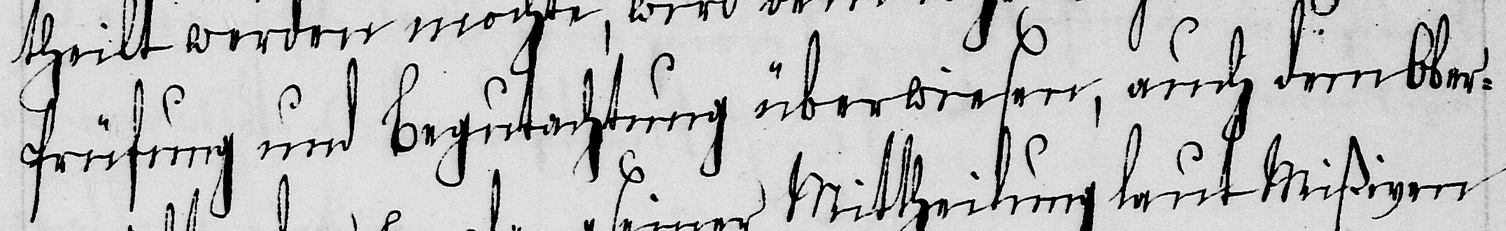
Prüfung und Begutachtung überwiesen, auch dem Ober¬
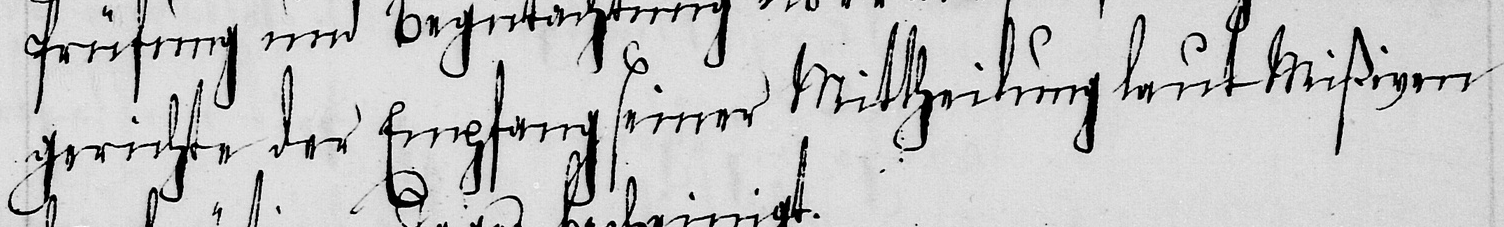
gerichte der Empfang seiner Mittheilung laut Mißiven
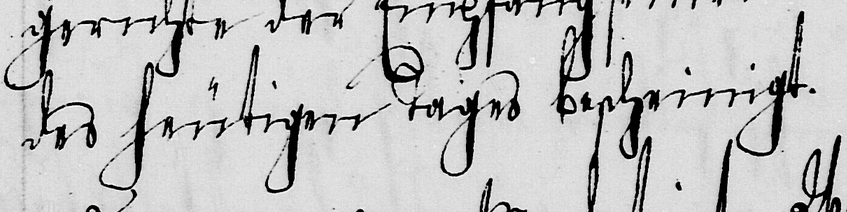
des heutigen Tages bescheinigt.
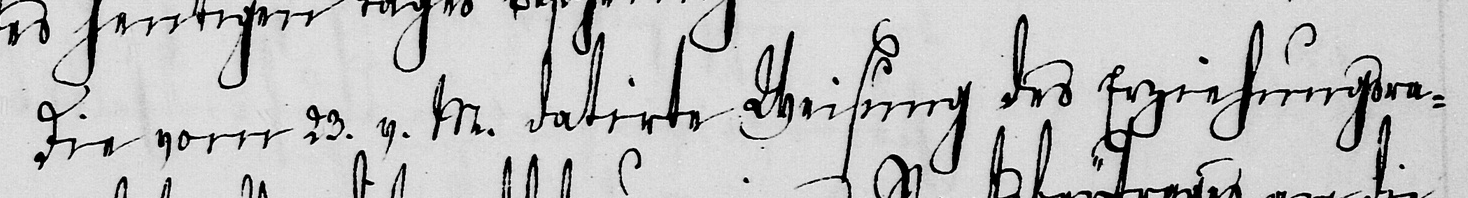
Die vom 23. v. M. datirte Weisung des Erziehungsra¬
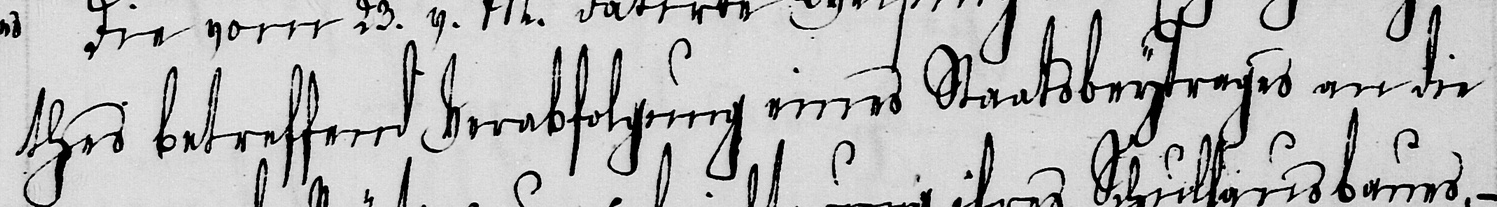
thes betreffend Verabfolgung eines Staatsbeytrages an die
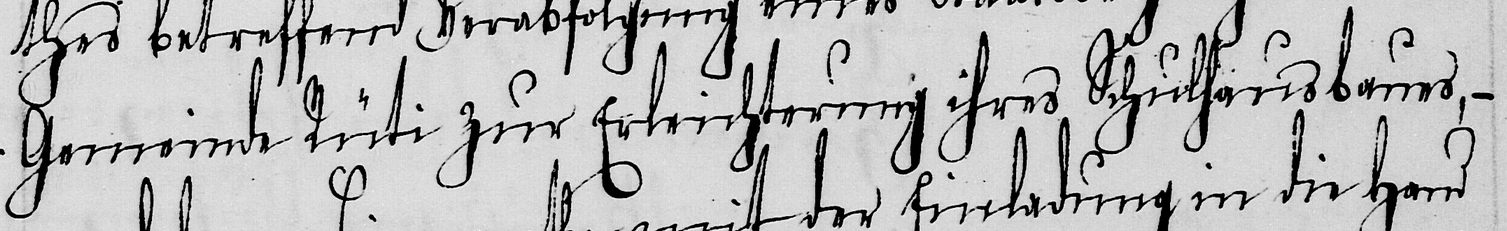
Gemeinde Rüti zur Erleichterung ihres Schulhausbaues,
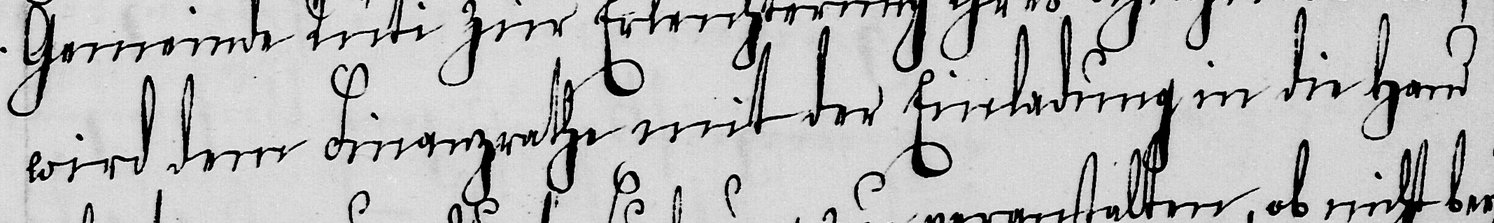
wird dem Finanzrathe mit der Einladung in die Hand
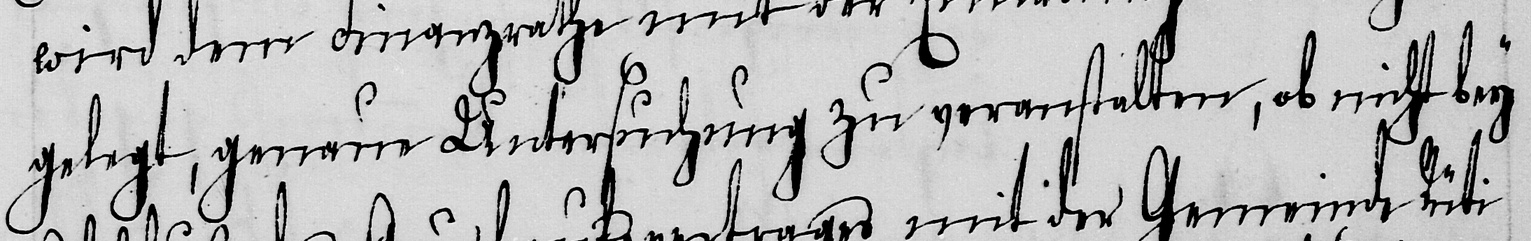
gelegt, genaue Untersuchung zu veranstalten, ob nicht bey
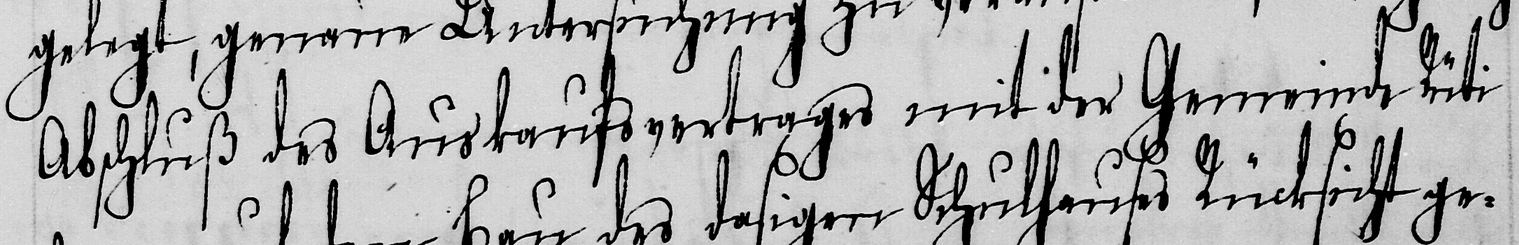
Abschluß des Auskaufsvertrages mit der Gemeinde Rüti
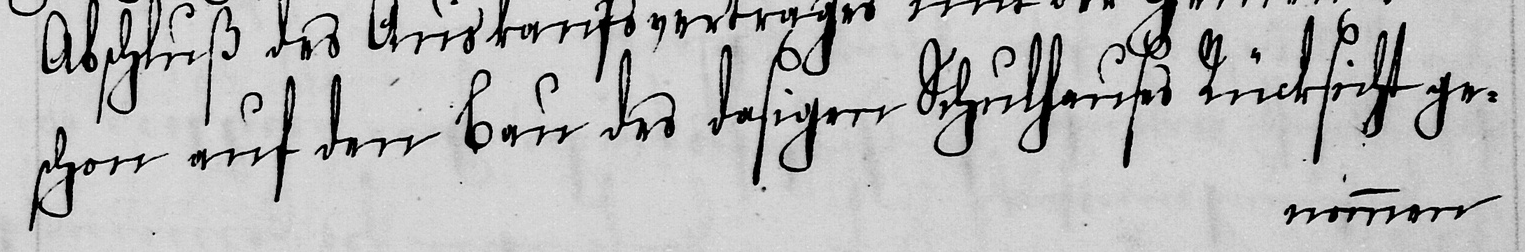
schon auf den Bau des dasigen Schulhauses Rücksicht ge-
